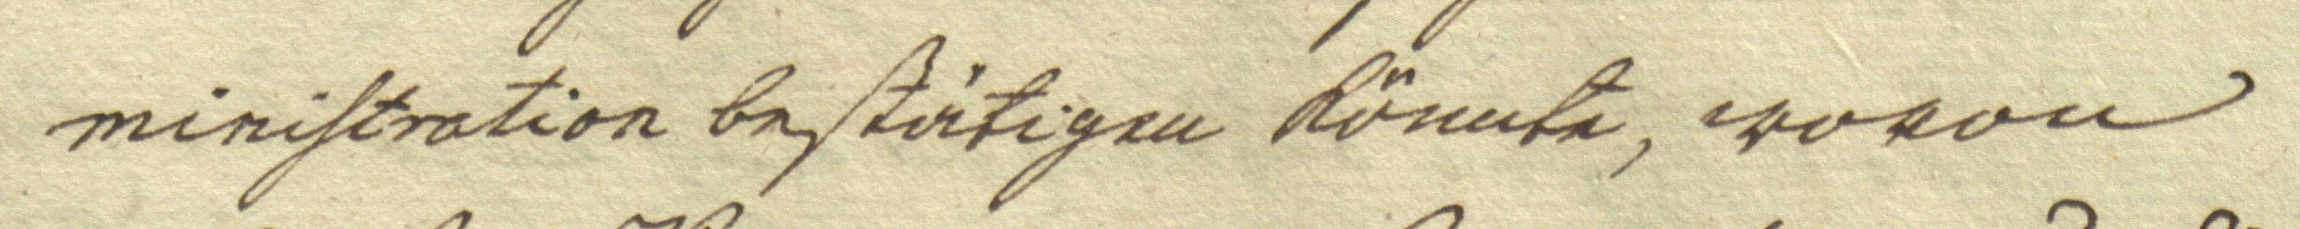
ministration bestätigen könnte, wovon
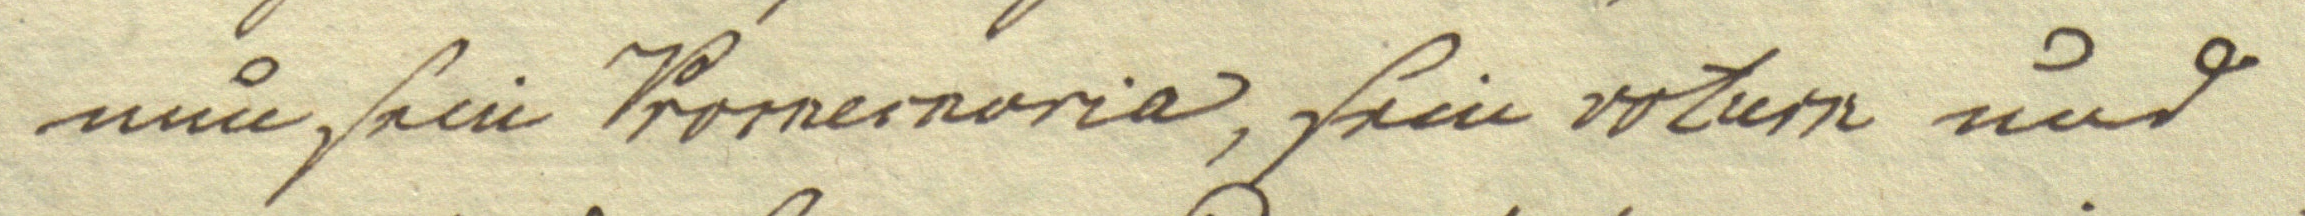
nun sein Promemoria, sein votum und
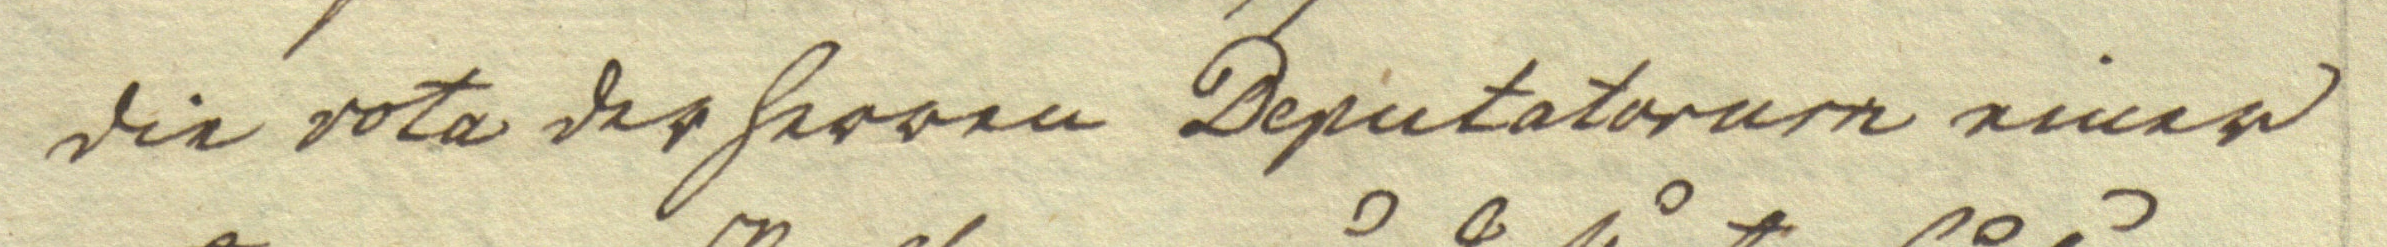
die vota der Herren Deputatorum einer
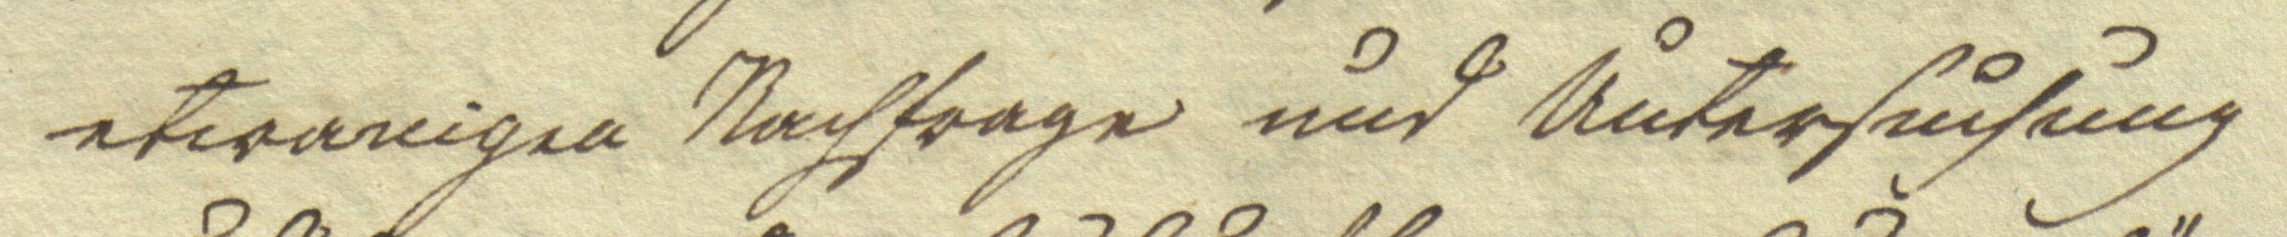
etwanigen Nachfrage und Untersuchung
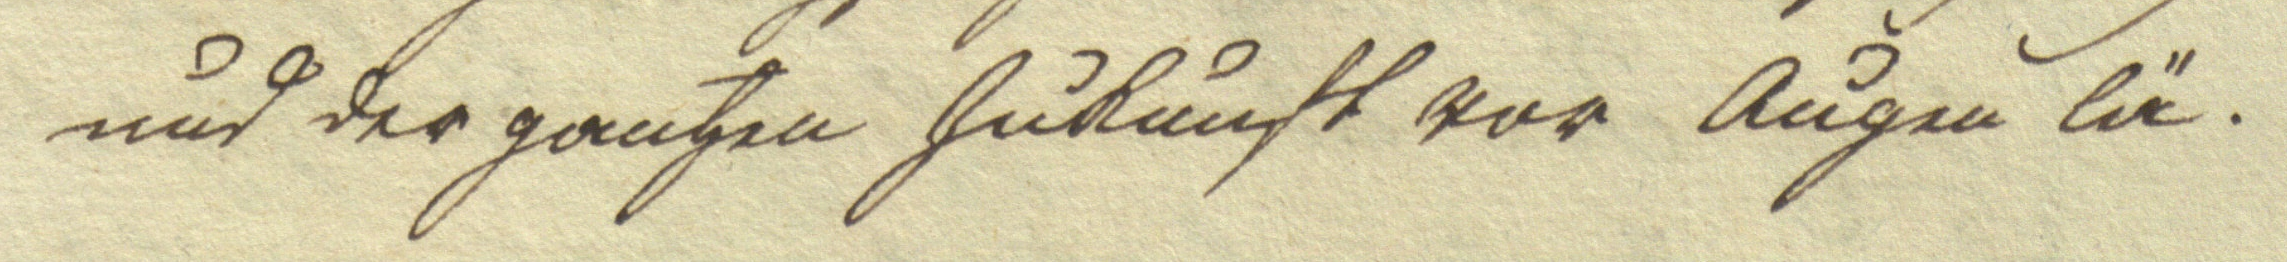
und der gantzen Zukunft vor Auge lä¬
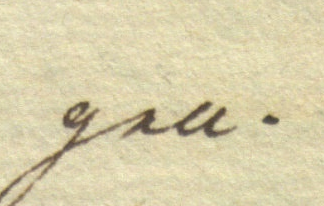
gen.
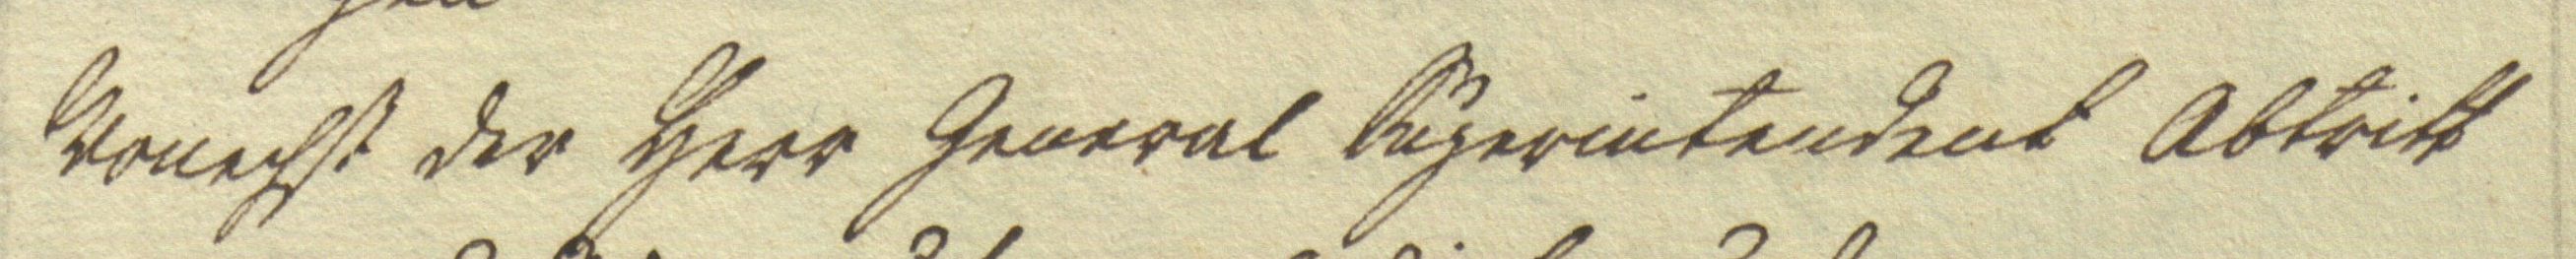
Wonechst der Herr General Superintendent Abtritt
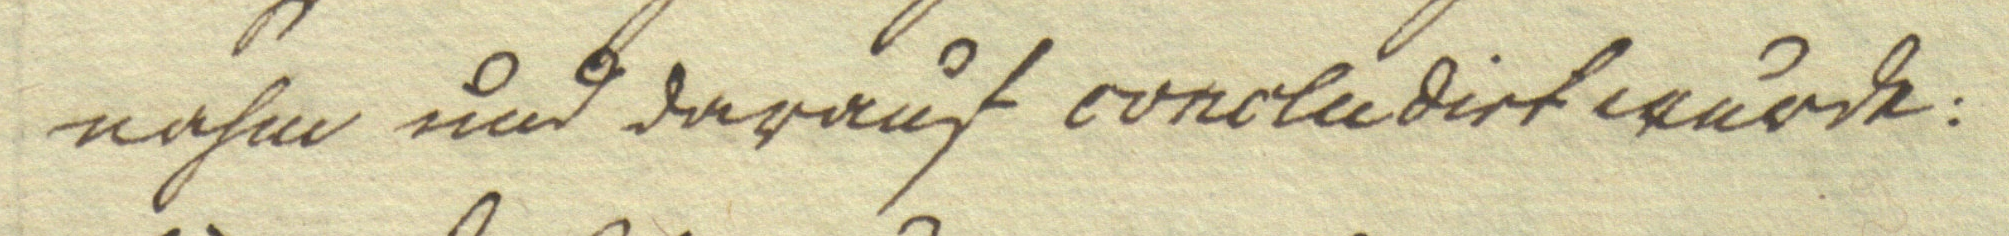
nahm und darauf concludirt wurde:
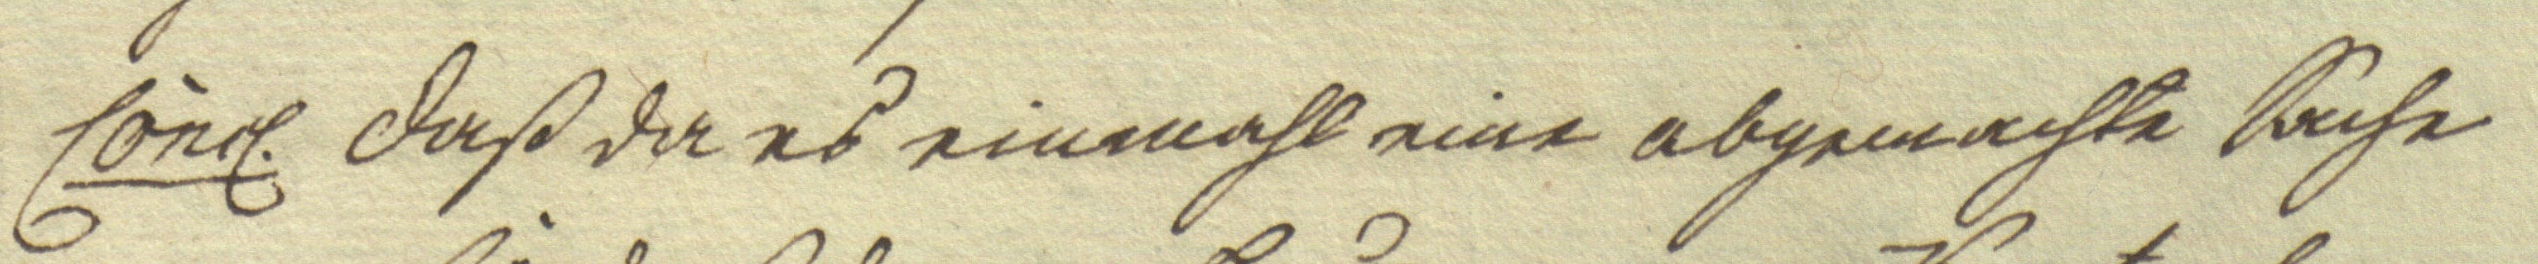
Concl. Daß da es einmahl eine abgemachte Sache
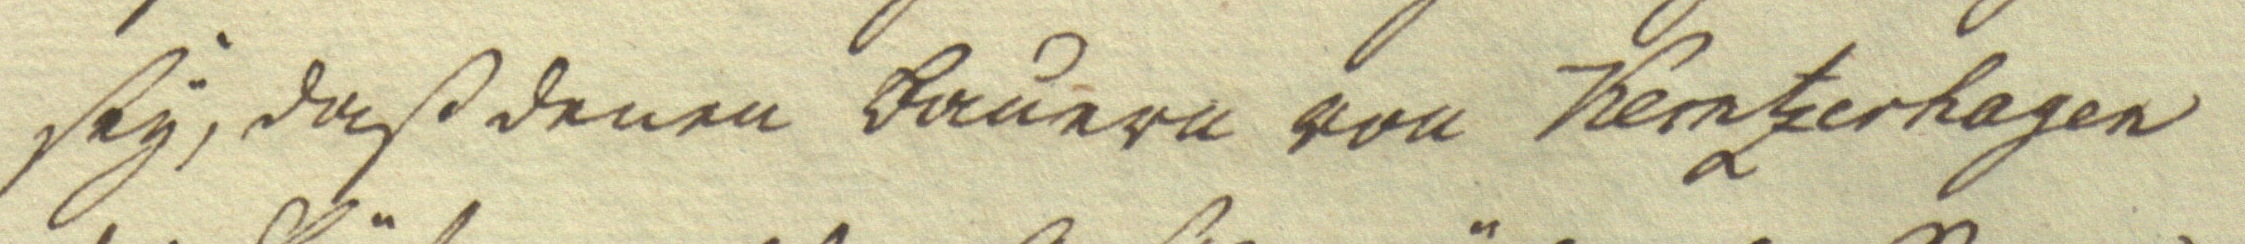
seÿ, daß denen Bauern von Kemtzerhagen
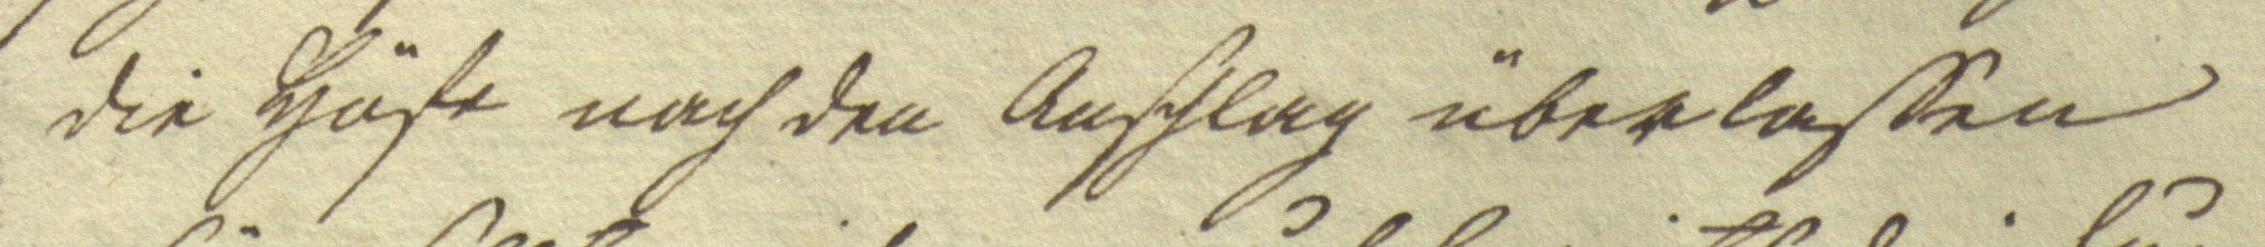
die Höfe nach den Anschlag überlassen
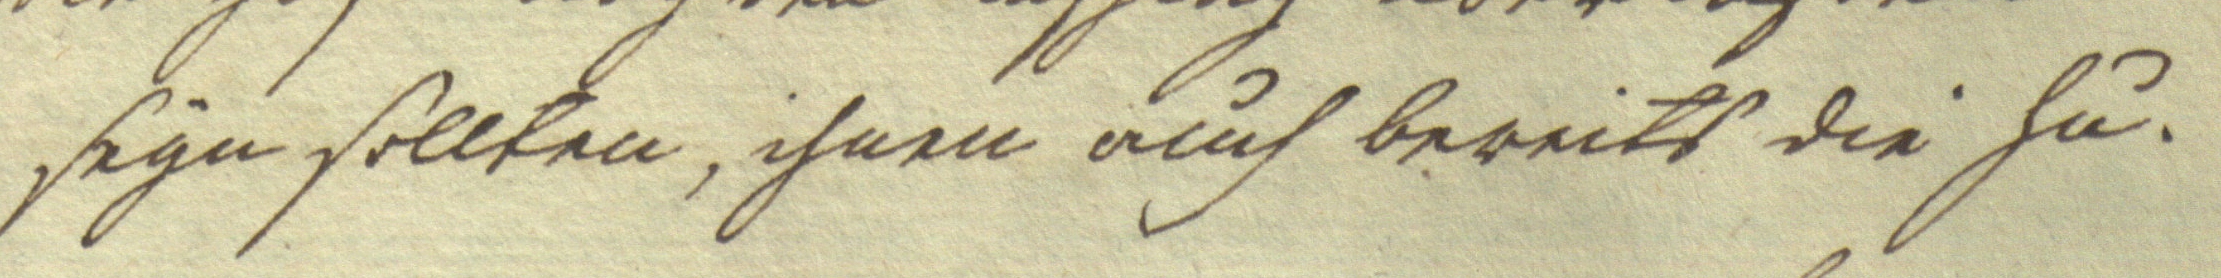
seÿn sollten, ihnen auch bereits die Hu¬
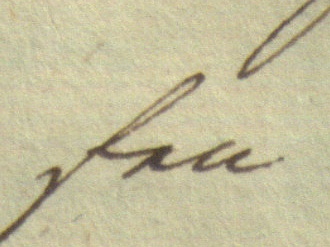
fen
